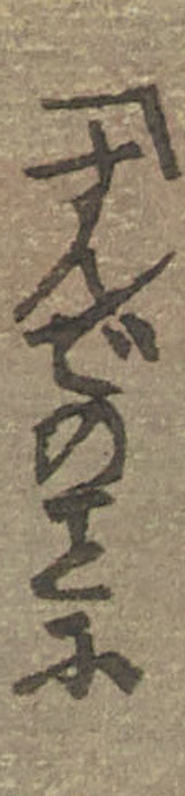「すんでのことに
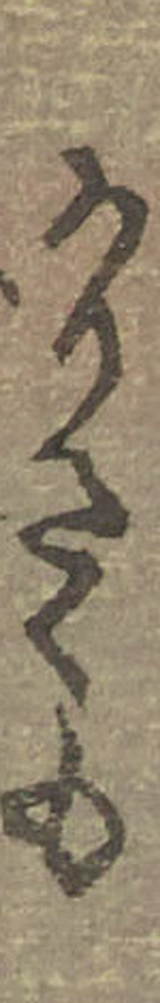かりたくも
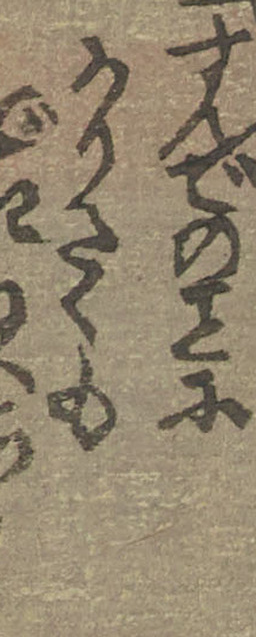かりたくも
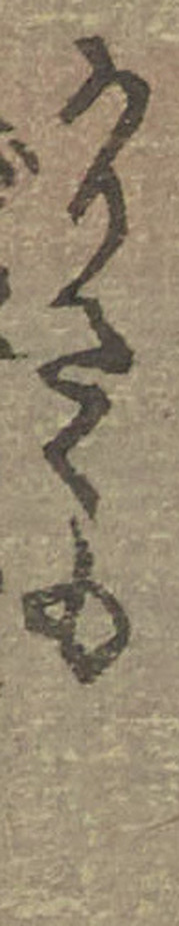かりたくも
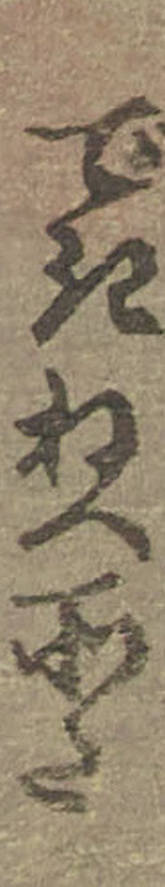できねへ所た
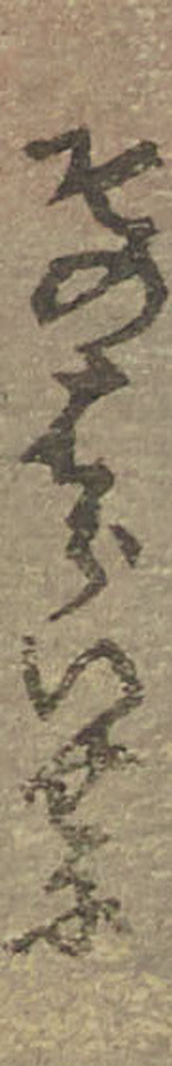そのはらいせに
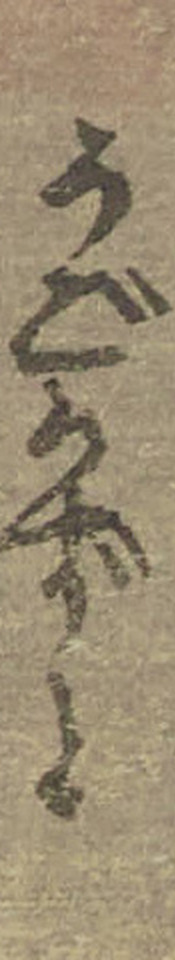うごかずと
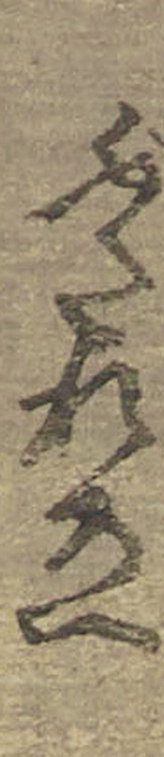ぶたれろへ
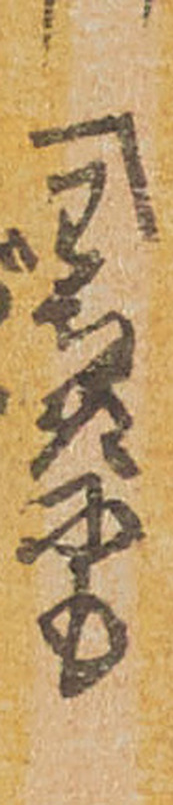「わちきにも
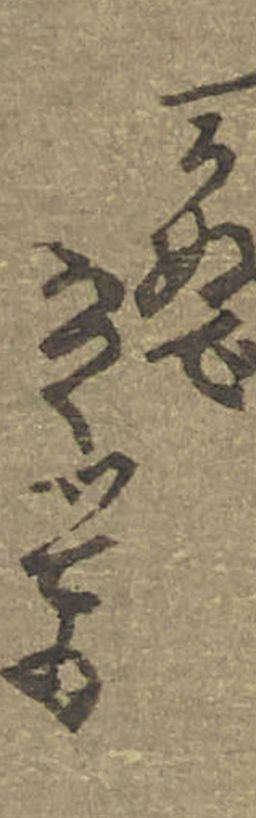なくつても
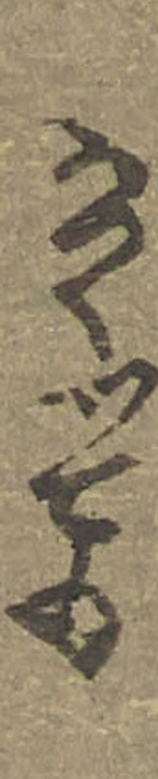なくつても
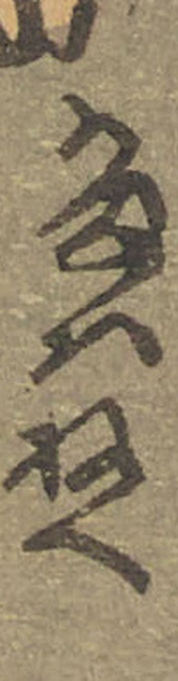かまはねへ
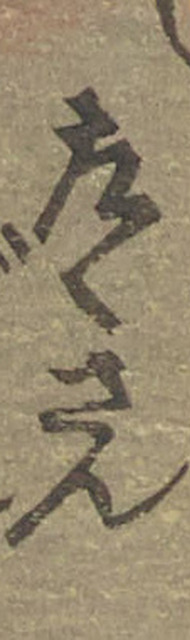たくさん
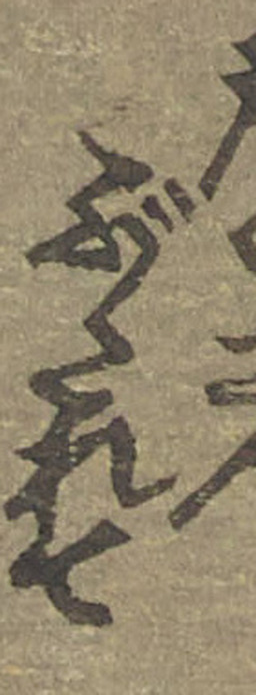ぶたれて
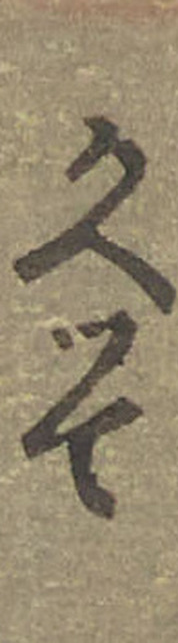かへつて
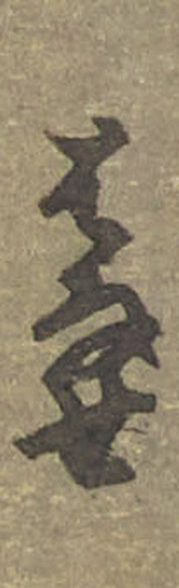はなせ
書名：[鯰仮宅にて打擲されるの図]
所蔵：東京大学総合図書館 General Library in the University of Tokyo, JAPAN
